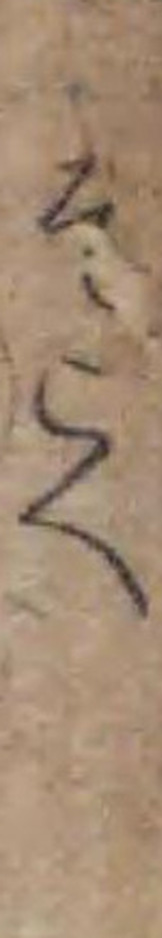そこへ
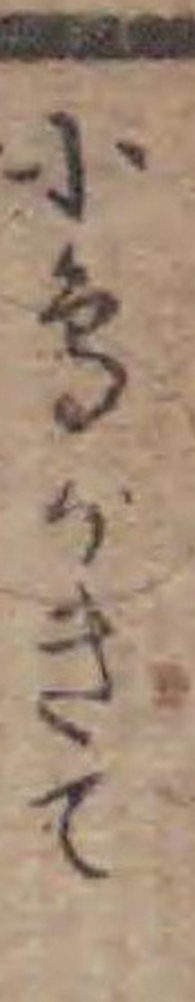小鳥がきて
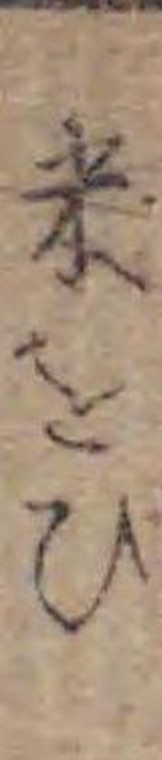米をひ
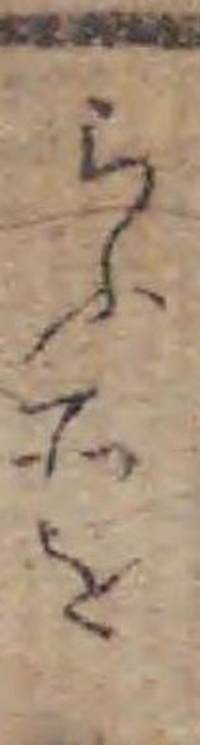らふ所を
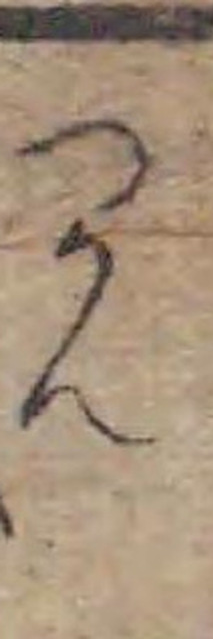つかん
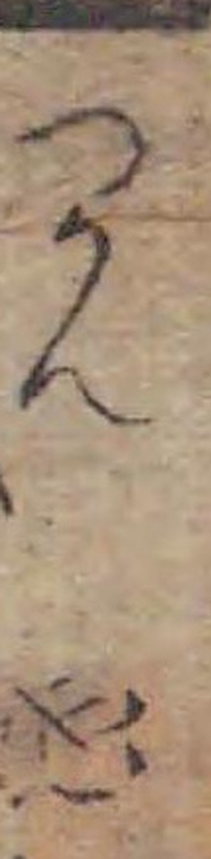つかん
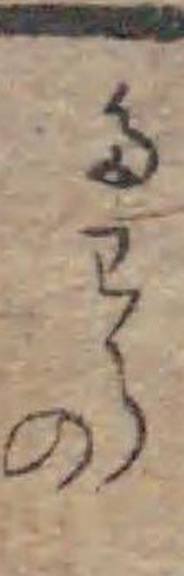たわらの
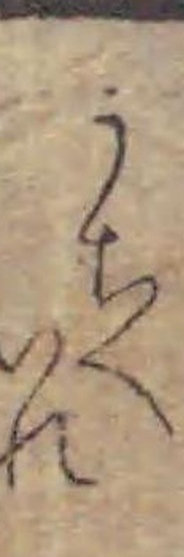うちへ
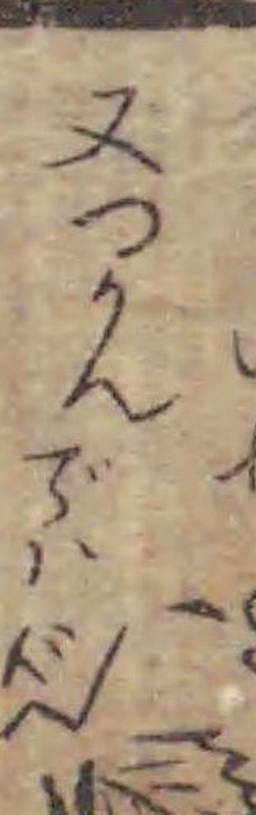又つかんでは
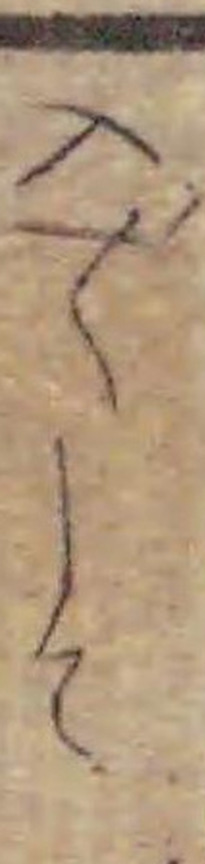入〳〵して
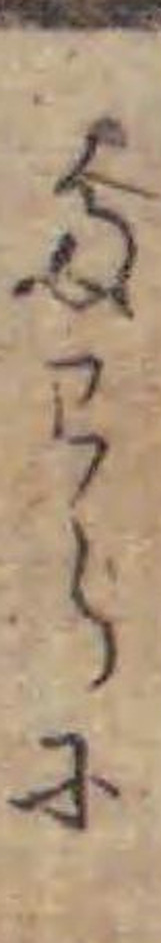たわらに
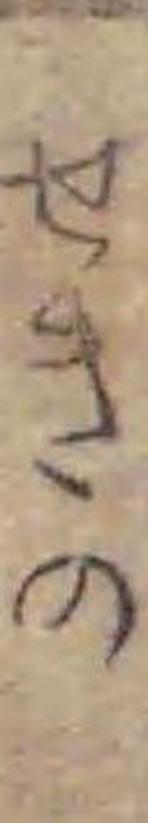せきの
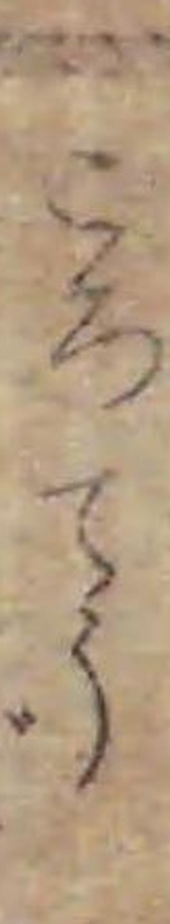ころてう
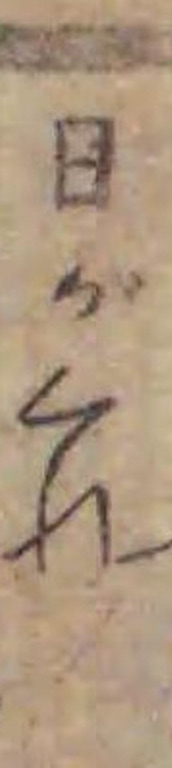日がくれ

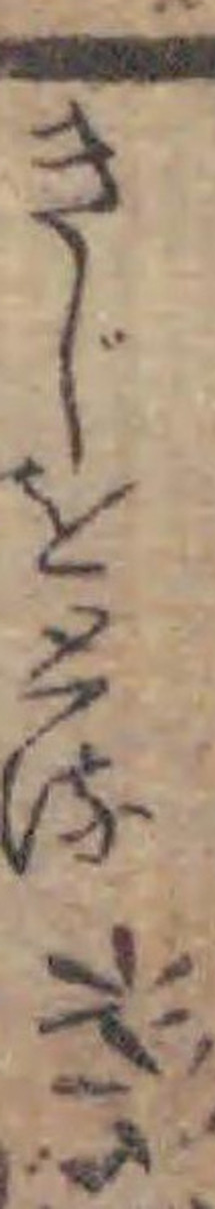きじをとる
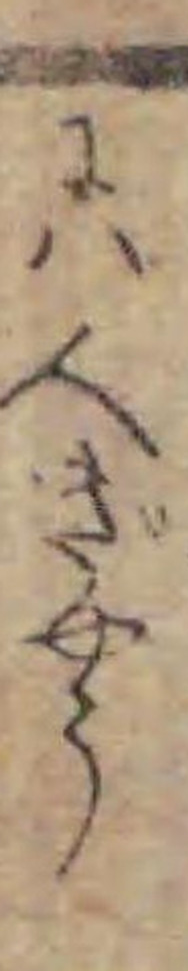には人ぎやう
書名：虚言八百万八伝 : 3巻
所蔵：国立国会図書館 National Diet Library, JAPAN
